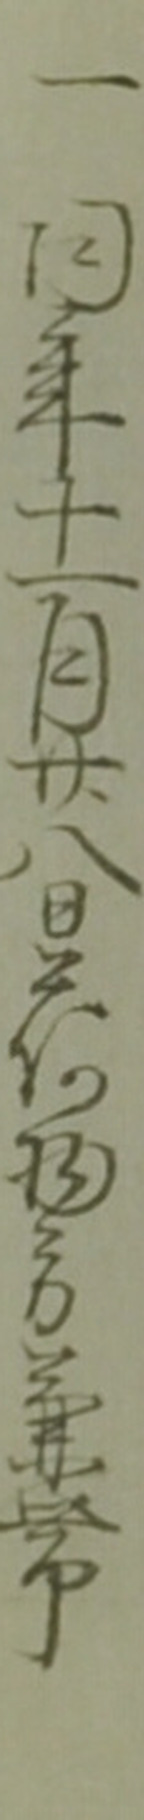一同年十一月廿八日荷物方兼帯

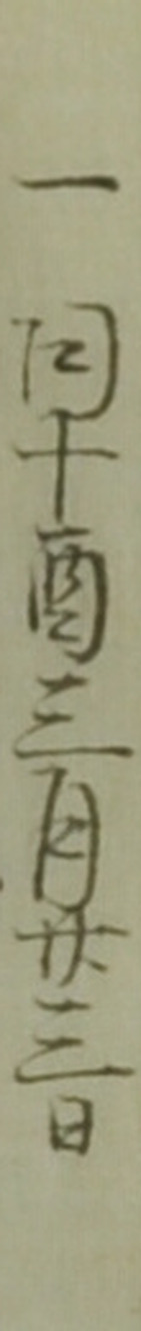一同十酉三月廿三日
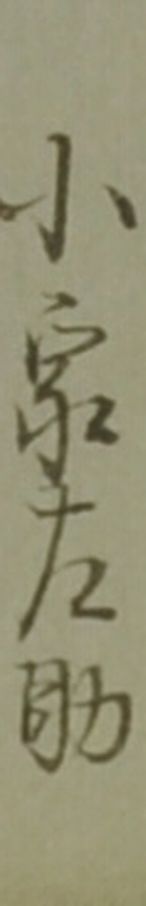小泉左助
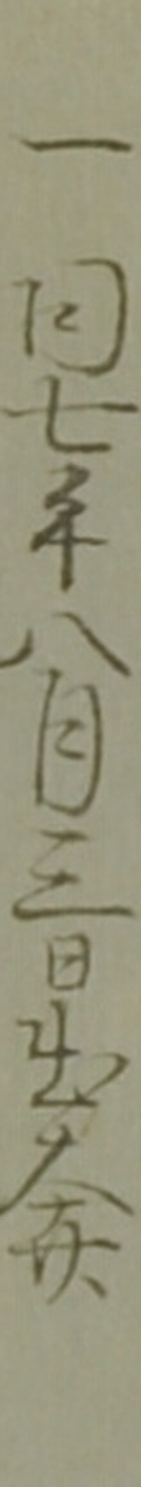一同七午八月三日出奔
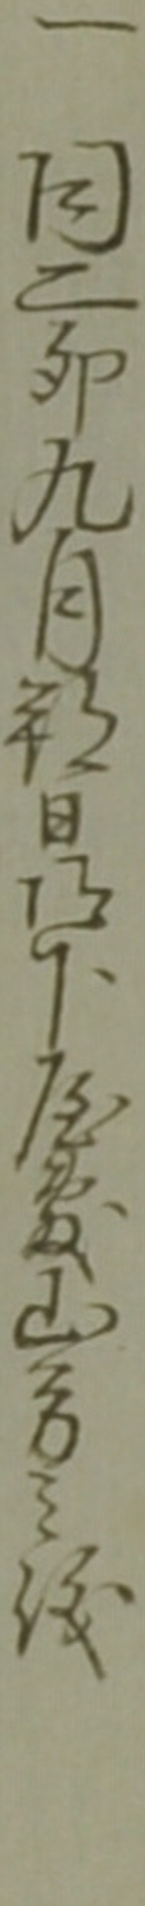一同二卯九月朔日御下屋敷山方之儀
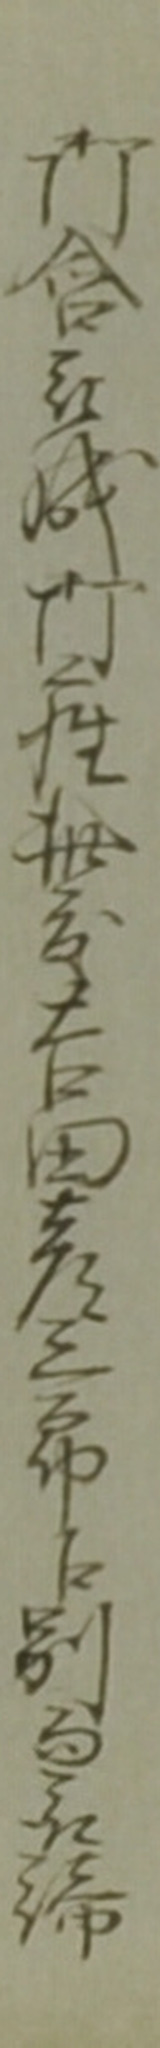御含被成御座此度吉田彦三郎江別而取締
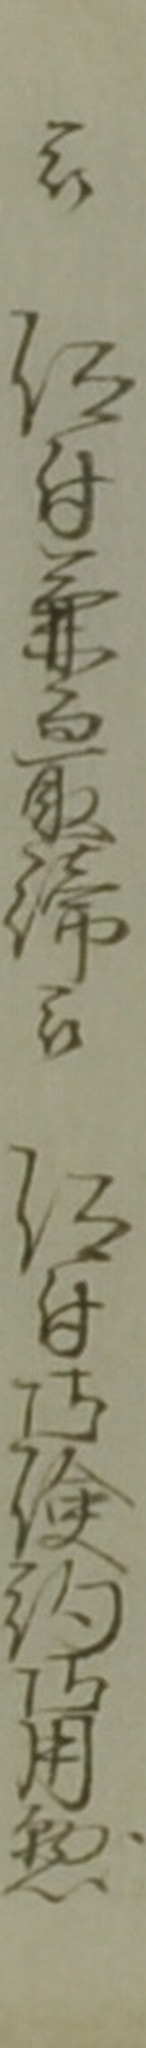被仰付兼而取締被仰付御倹約御用懸
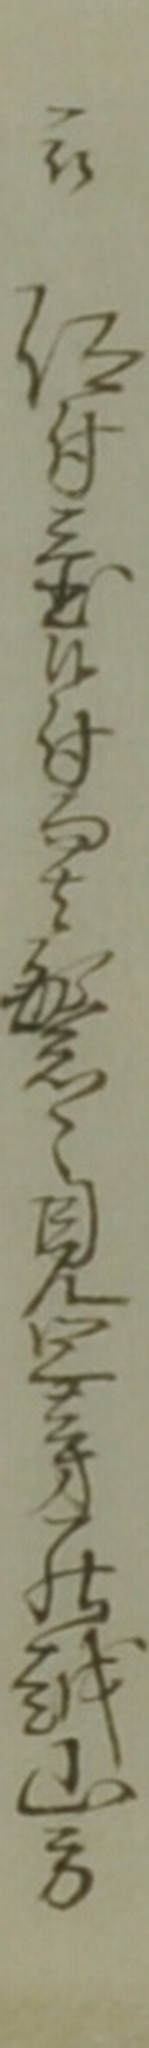被仰付置候付而者繁々見廻旁罷越山方
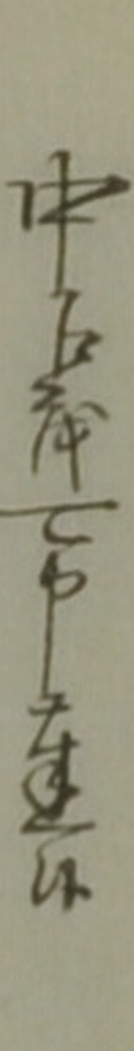中江茂可申達候
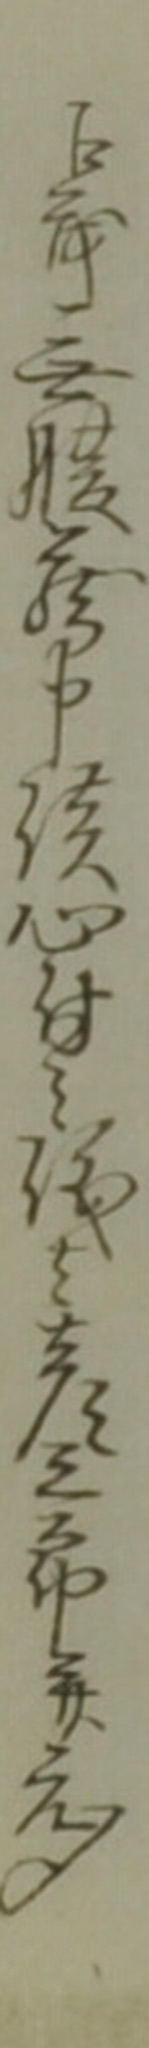江茂無腹蔵申談心付之儀者彦三郎并元〆
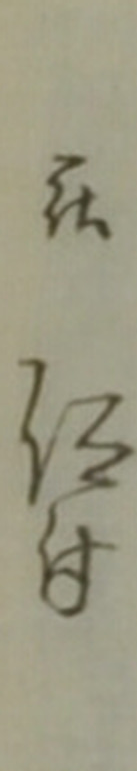被仰付
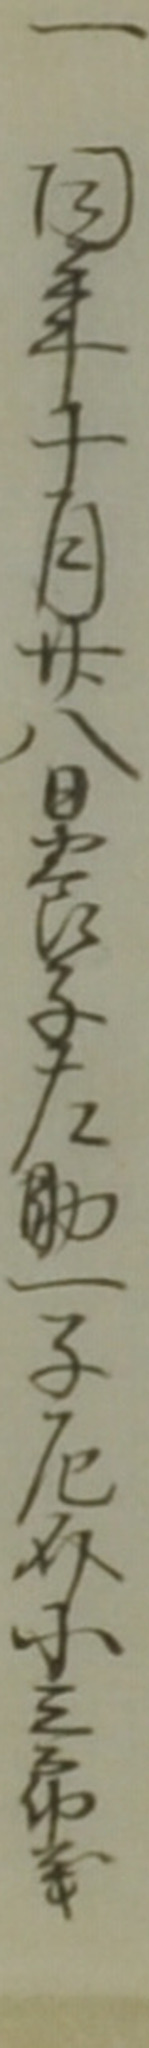一同年十月廿八日養子左助一子厄介小三郎義
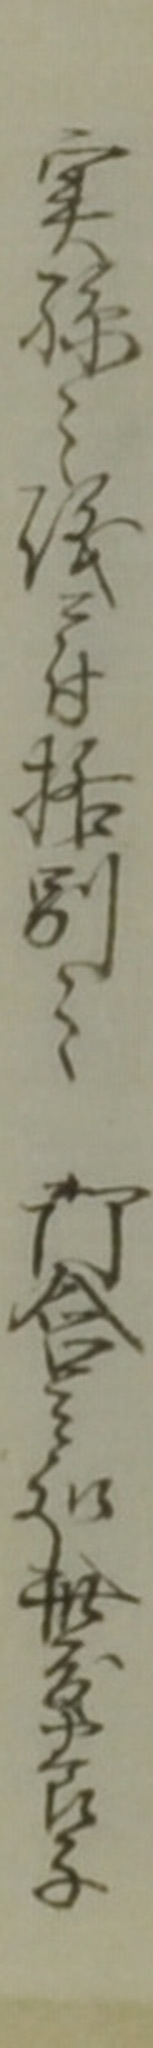実孫之儀ニ付格別之御含之処此度養子
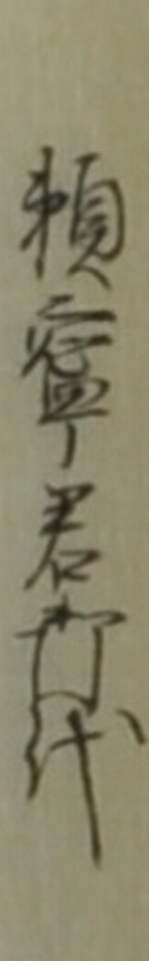頼寧君御代
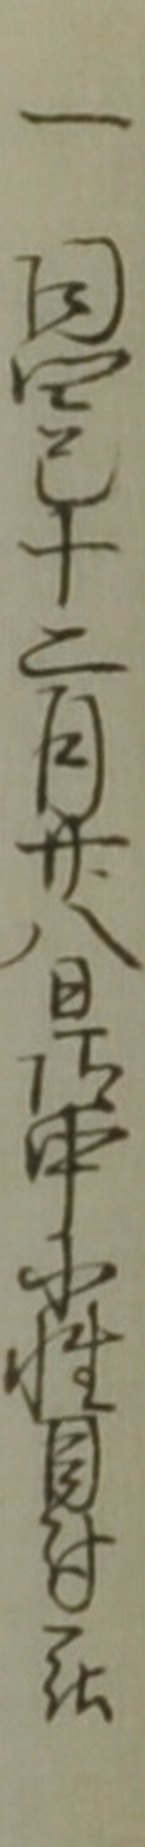一同四巳十二月廿八日御中小性目付被
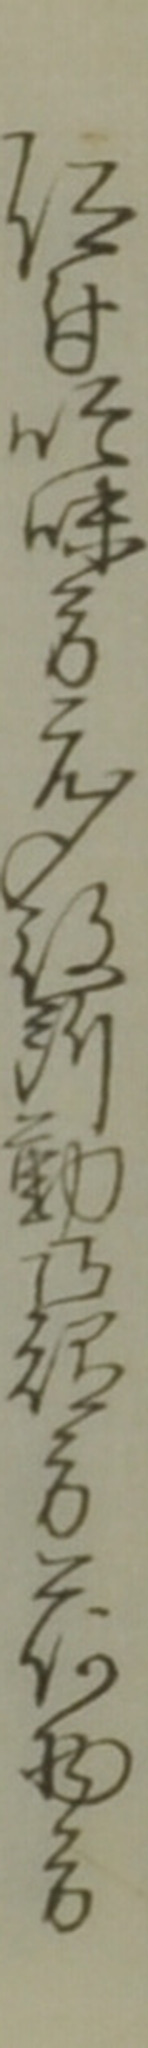仰付吟味方元〆役所勤御賄方荷物方
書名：無足諸士勤仕録（一）
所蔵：伊那市立高遠町図書館・合同会社AMANE
